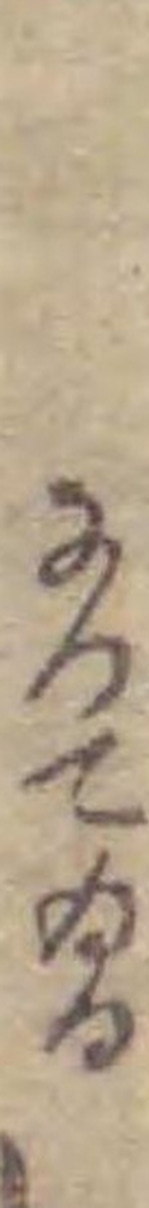なつてゐる
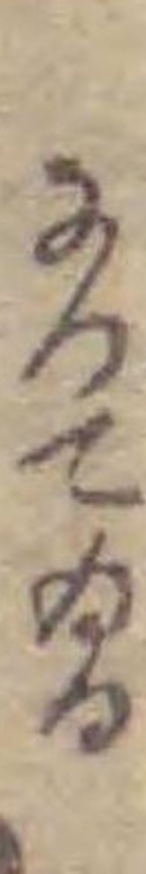なつてゐる
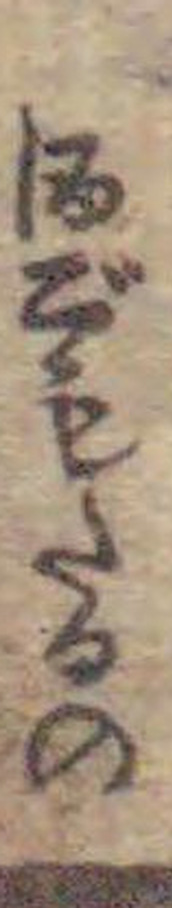酒ごもたるの
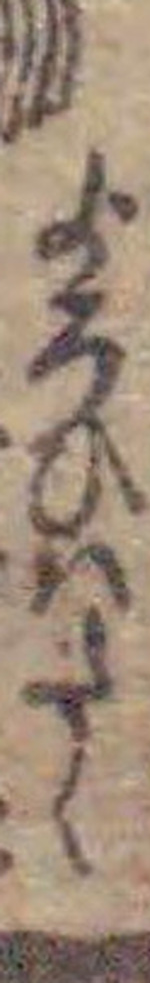よろひはたく
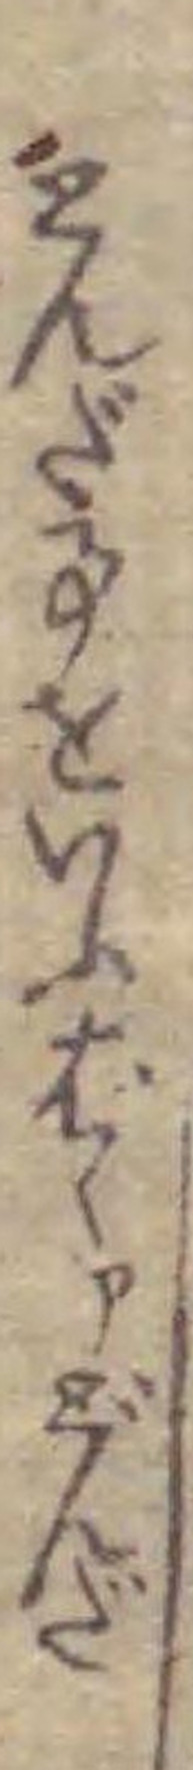とんだ事をいふばゝ
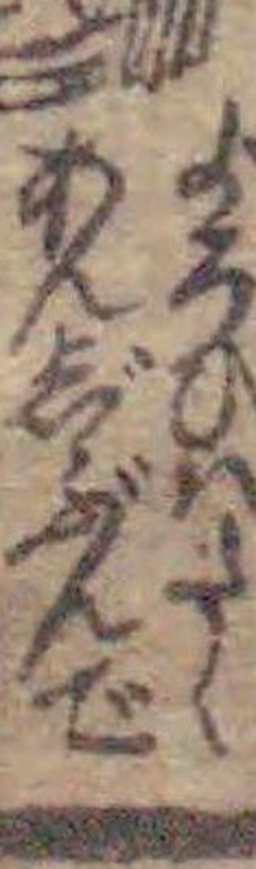あんじぶんで
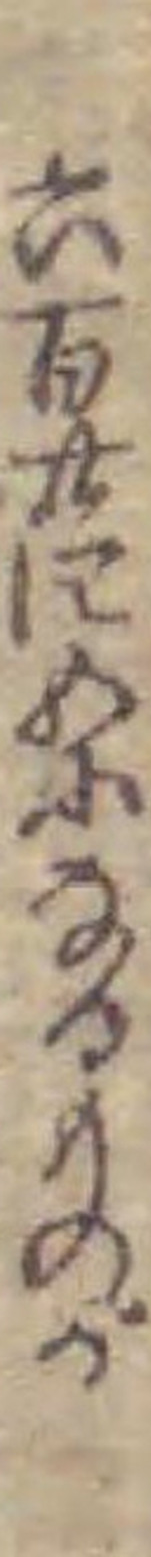六百廿四五になるものが
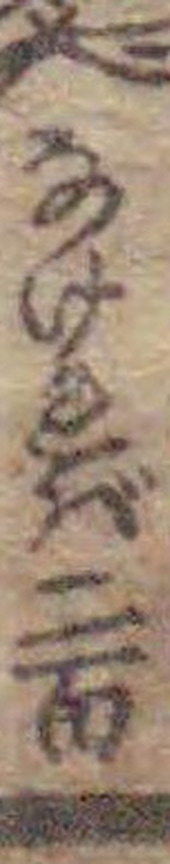なければ二百
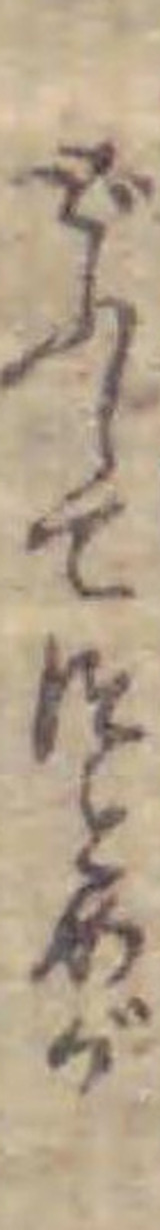どふしてつとめが
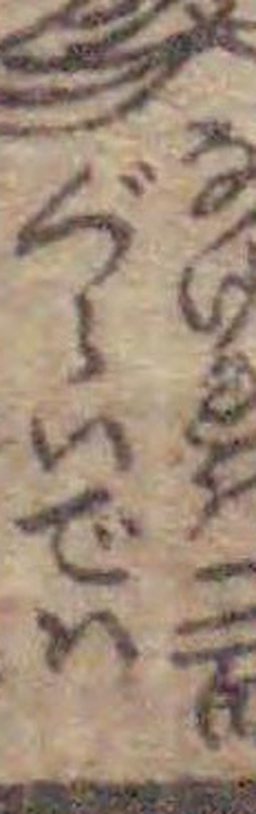ぐらいでは
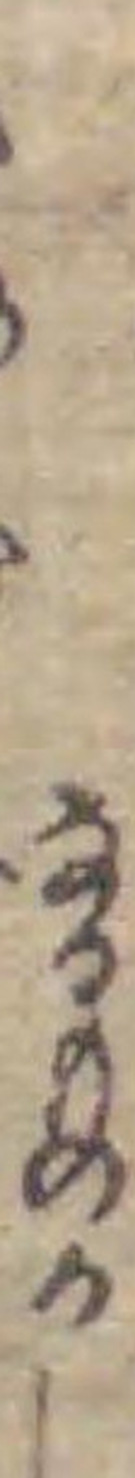なるものか
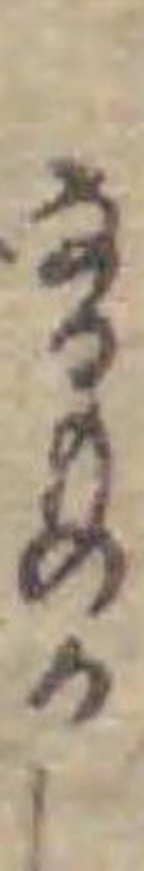なるものか
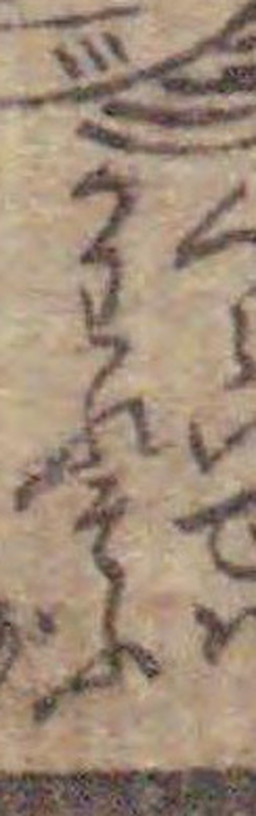かわふそふ
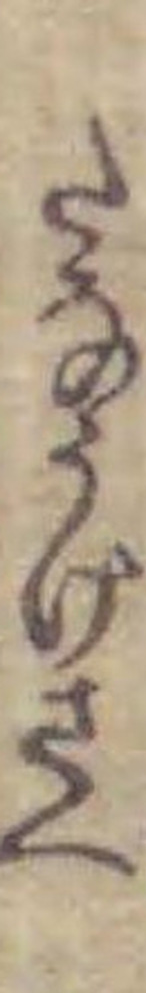たなうけさへ
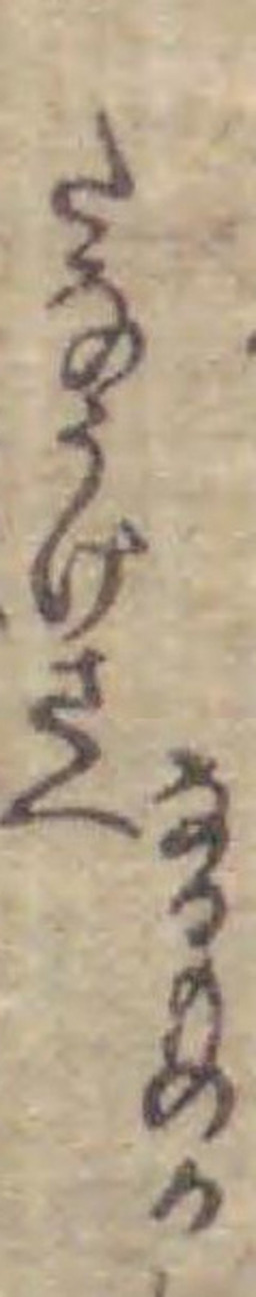たなうけさへ
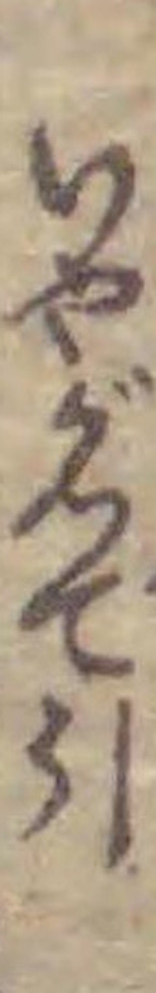いやがつて引
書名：年寄之冷水曽我 : 3巻
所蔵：国立国会図書館 National Diet Library, JAPAN
